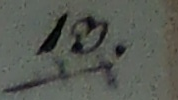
13.
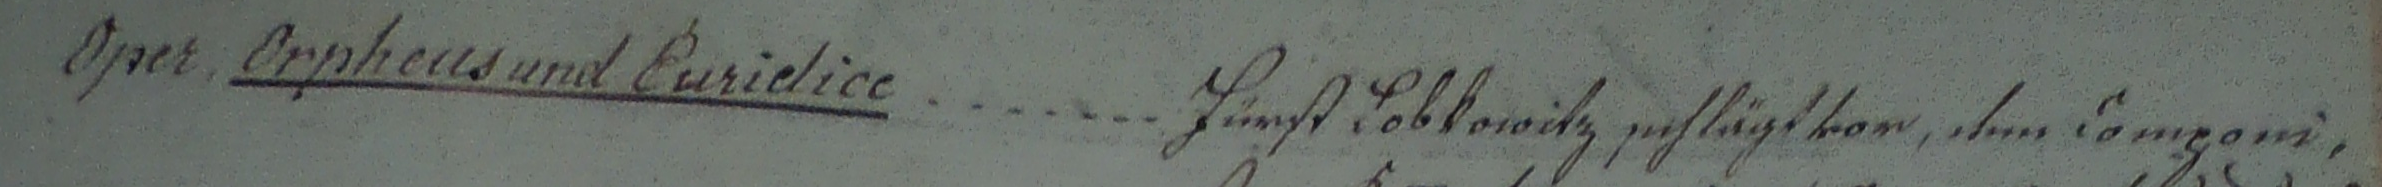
Oper, Orpheus und Euridice ……. Fürst Lobkowitz schlägt vor, dem Componi¬
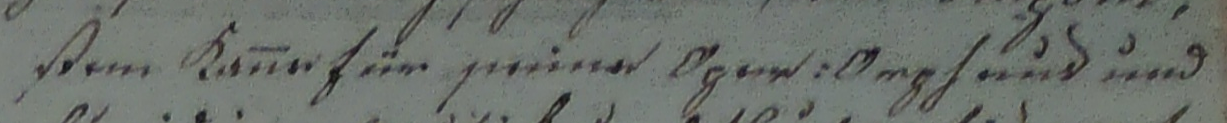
sten Kan̅e für seine Oper: Orpheus und
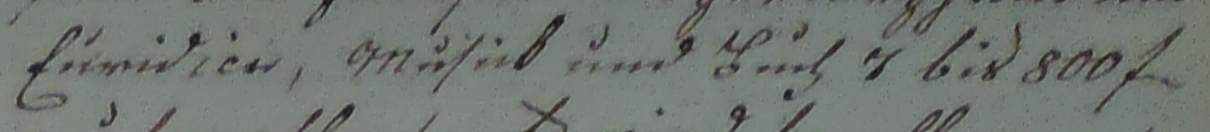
Euridice, Musick und Buch 7 bis 800 fn
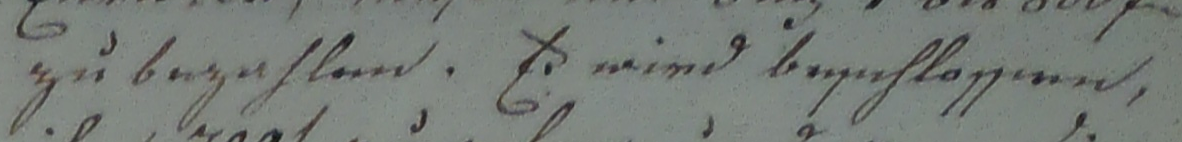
zu bezahlen. Es wird beschlossen,
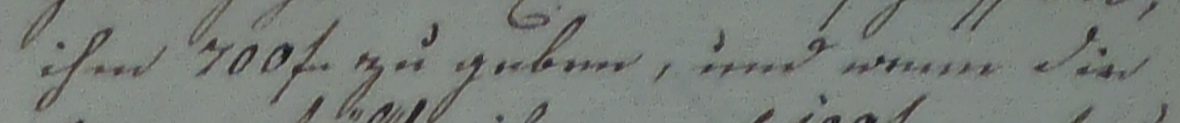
ihm 700fn zu geben, und wenn die
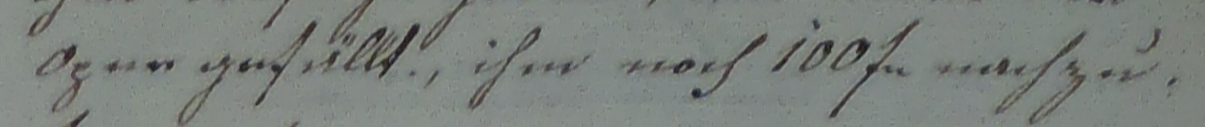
Oper gefällt., ihm noch 100fn nachzu¬
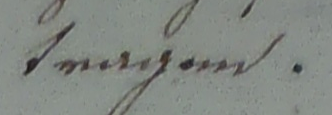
tragen.
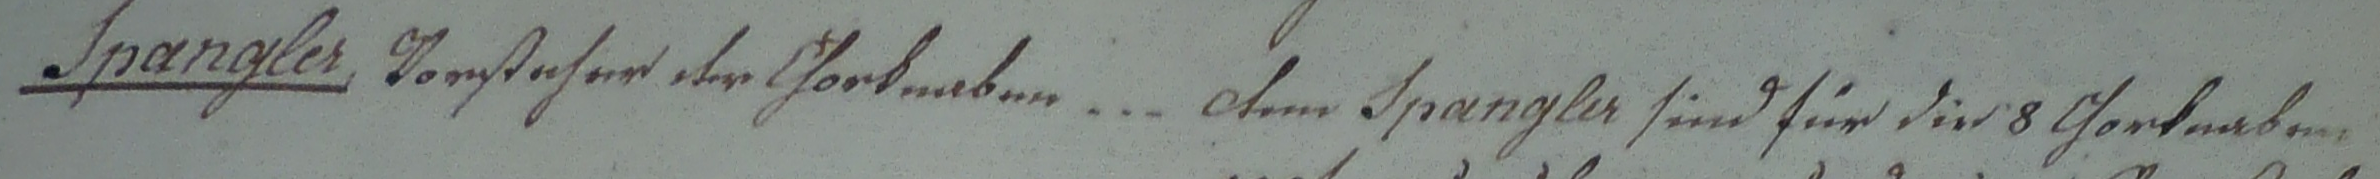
Spangler, Vorsteher der Chorknaben … Dem Spangler sind für die 8 Chorknaben
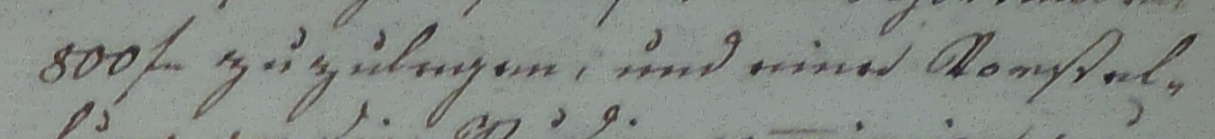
800 fn zuzulegen, und eine Vorstel¬
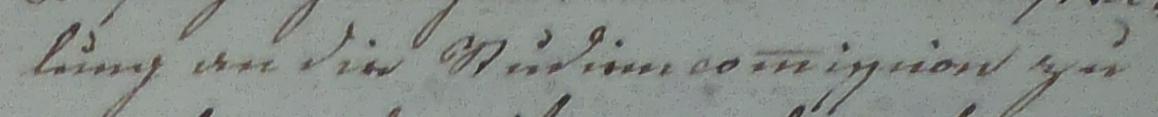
lung an die Studiencom̅ission zu
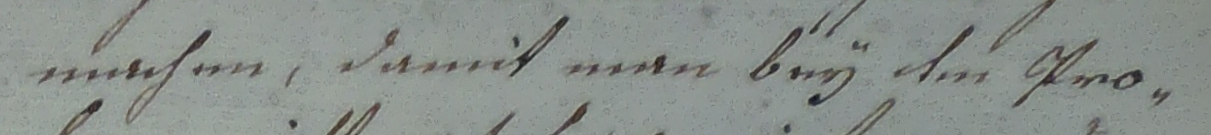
machen, damit man bey den Pro¬
